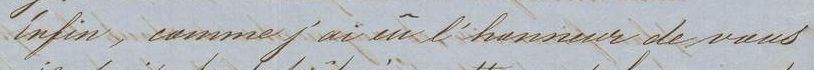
Enfin, comme j'ai eû l'honneur de vous
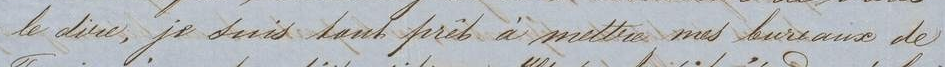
le dire, je suis tout prêt à mettre mes bureaux de
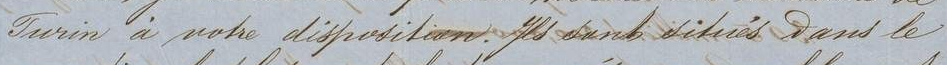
Turin à votre disposition. Ils sont situés dans le
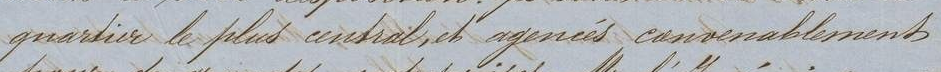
quartier le plus central, et agencés convenablement
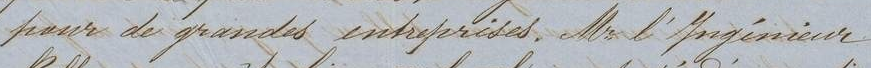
pour de grandes entreprises. Mr l'Ingénieur
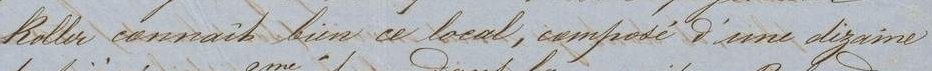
Koller connaît bien ce local, composé d'une dizaine
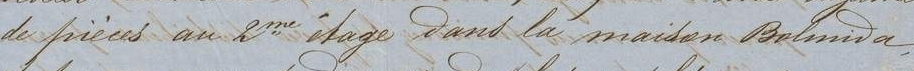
de pièces au 2me étage dans la maison Bolmida,
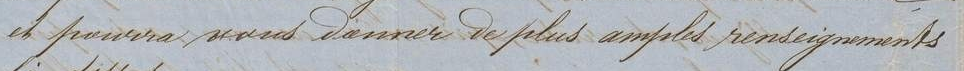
et pourra vous donner de plus amples renseignements
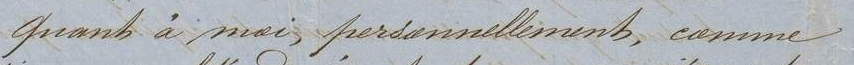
Quant à moi, personnellement, comme
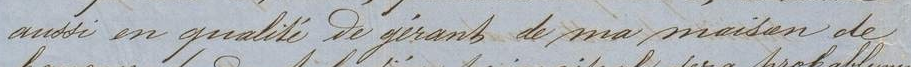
aussi en qualité de gérant de ma maison de
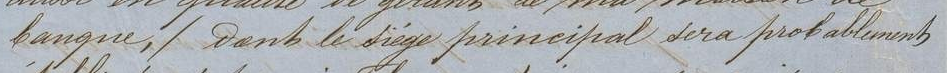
banque, (dont le siége principal sera probablement
